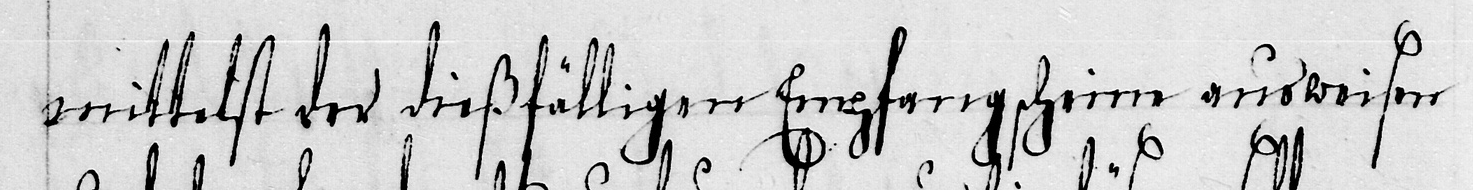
mittelst der dießfälligen Empfangscheine ausweisen
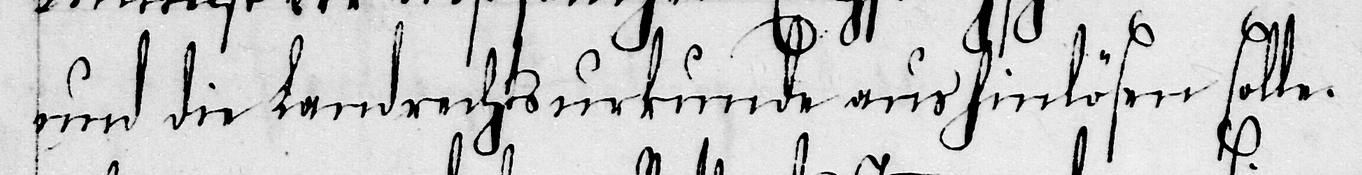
und die Landrechtsurkunde aushinlösen solle.
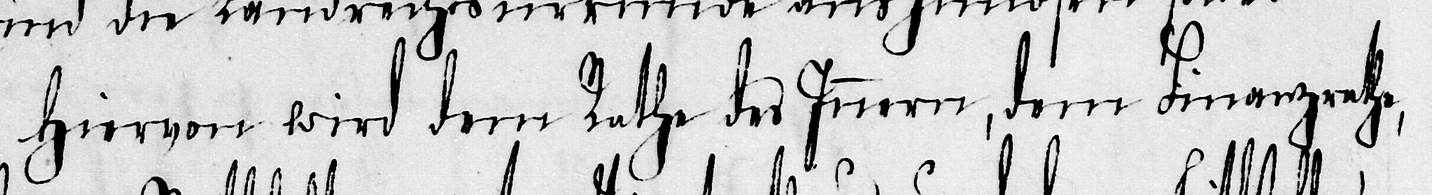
Hiervon wird dem Rathe des Innern, dem Finanzrathe,
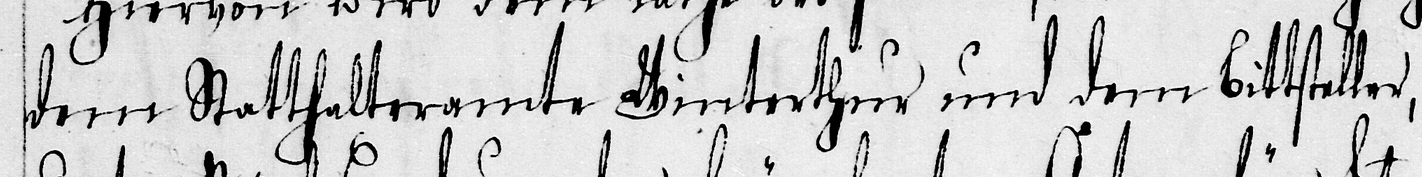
dem Statthalteramte Winterthur und dem Bittstel¬
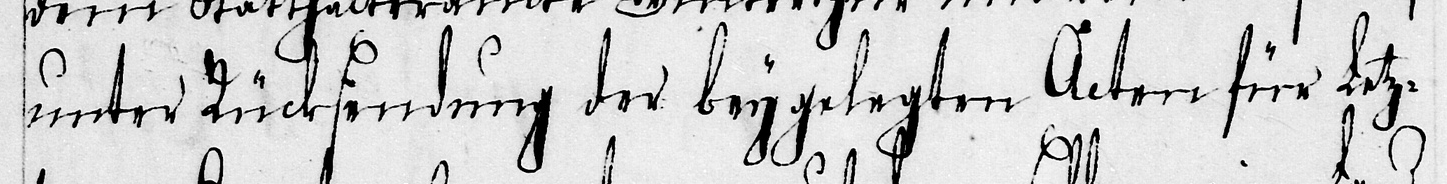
unter Rücksendung der beygelegten Acten für Letz¬
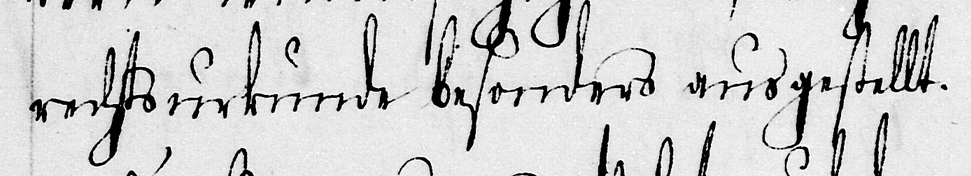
rechtsurkunde besonders ausgestellt.
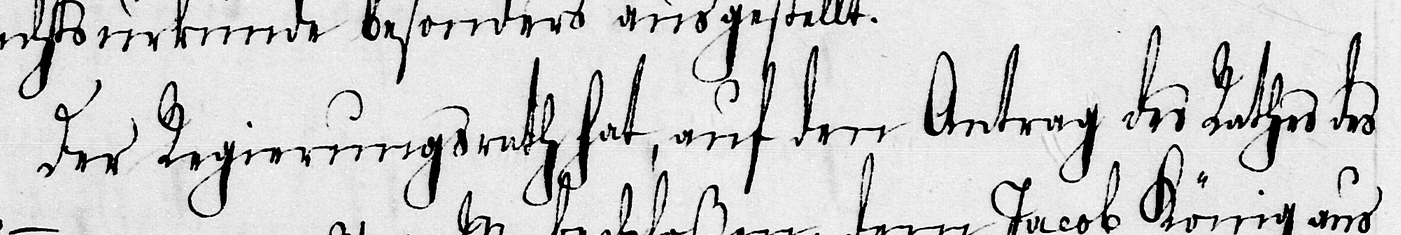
Der Regierungsrath hat, auf den Antrag des Rathes
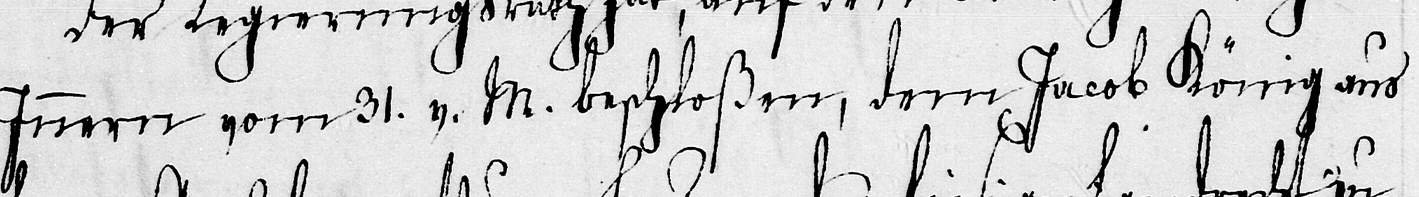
Innern vom 31. v. M. beschloßen, dem Jacob König aus
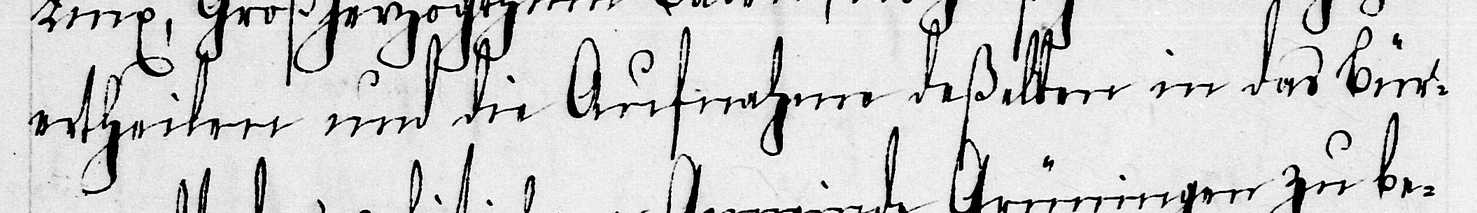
ertheilen und die Aufnahme deßelben in das Bür¬
